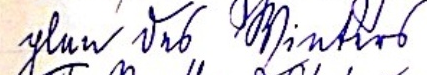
plan des Winters.
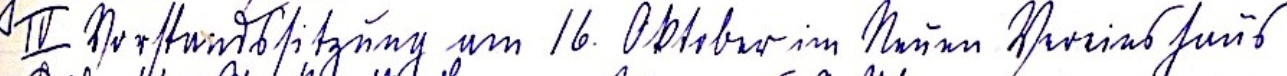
IV. Vorstandsitzung am 16. Oktober im Neuen Vereinshaus
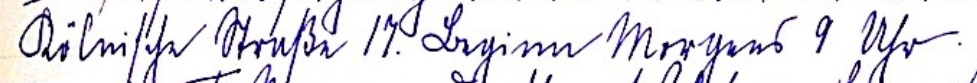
Polnische Straße 17. Beginn Morgens 9 Uhr.
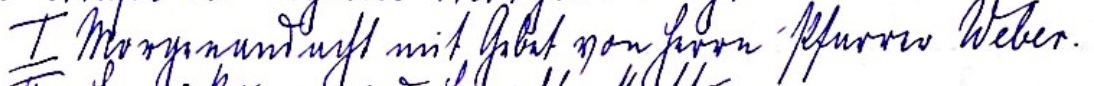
I. Morgenandacht mit Gebet von Herrn Pfarrer Weber
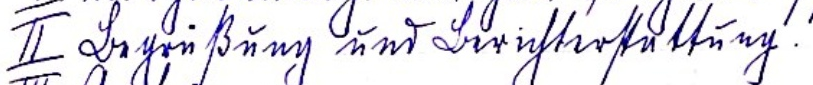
II. Begrüßung und Berichterstattung
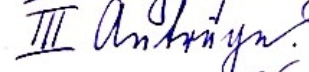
III. Anträge
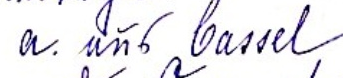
a. aus Cassel
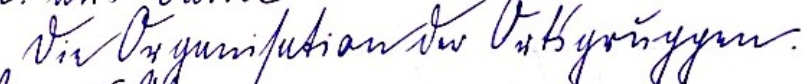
die Organisation der Ortsgruppen
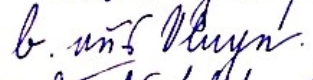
b. aus Vluyn
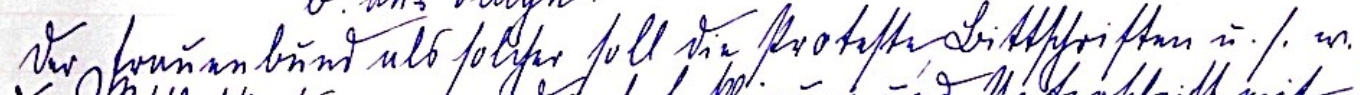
Der Frauenbund als solcher soll die Proteste, Bittschriften u.f.m.
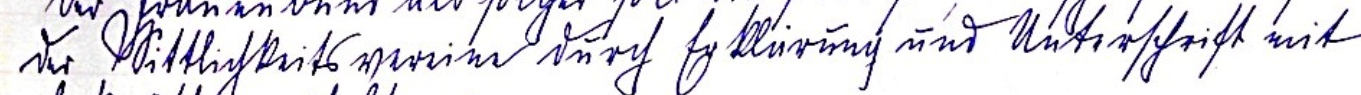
der Sittlichkeitsverein durch Erklärung und Unterschift mit
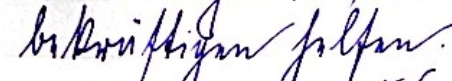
bekräftigen helfen.
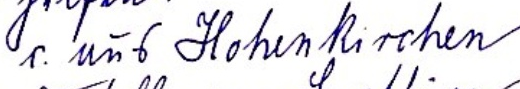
c. aus Hohenkirchen
